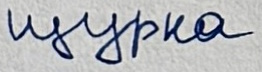щурка
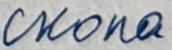скопа
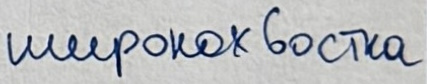широкохвостка
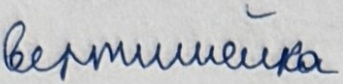вертишейка
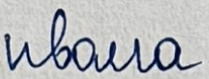иволга
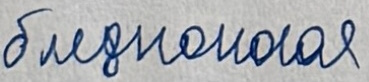бледноногая
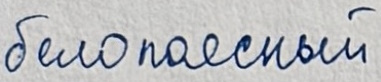белопоясный
